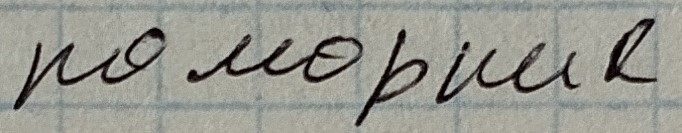поморник
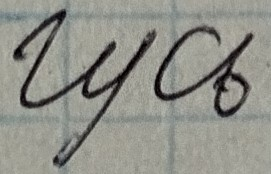гусь
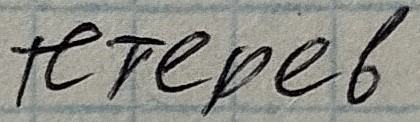тетерев
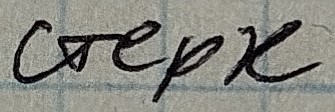стерх
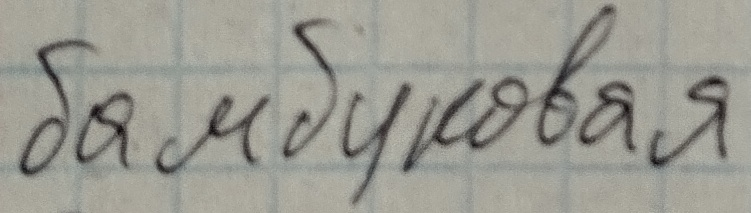бамбуковая
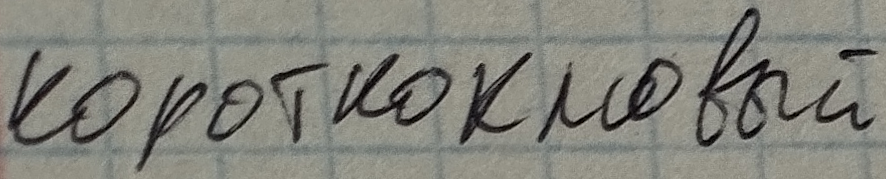короткоклювый
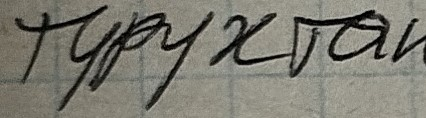турухтан
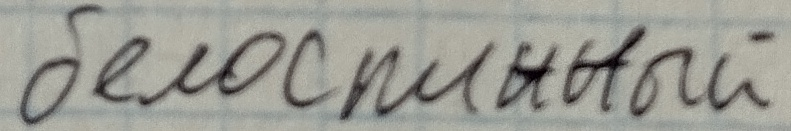белоспинный
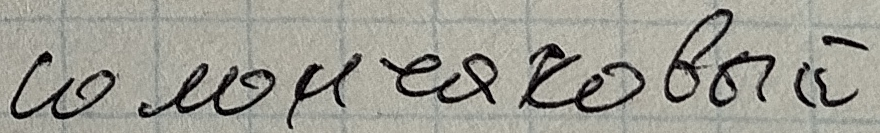солончаковый
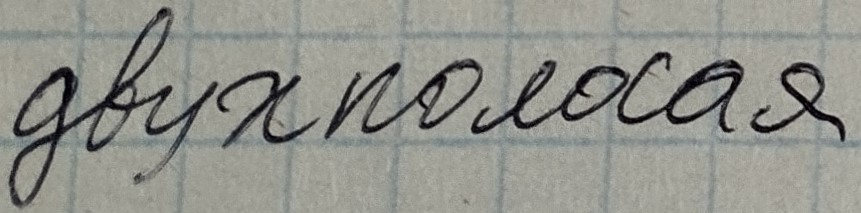двухполосая
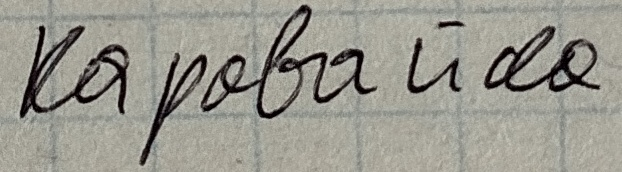каровайка
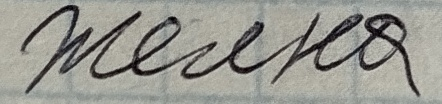желна
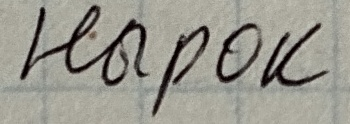нырок
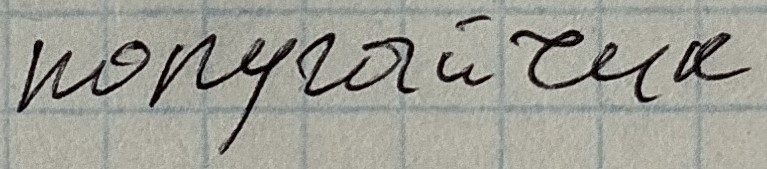попугайчик
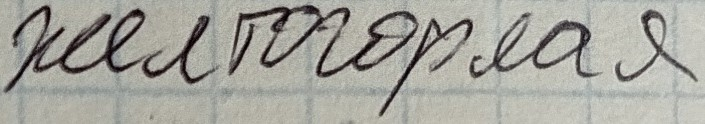желтогорлая
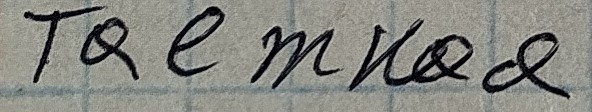таежная
